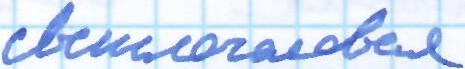светлоголовая
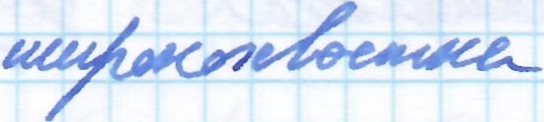широкохвостка
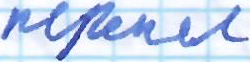перепел
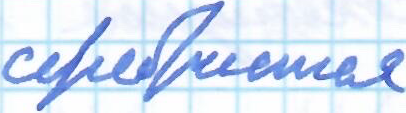серебристая
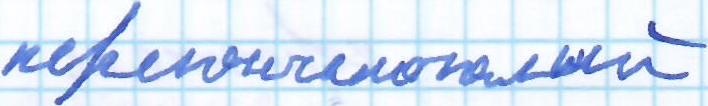перепончатопалый
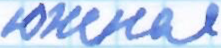южная
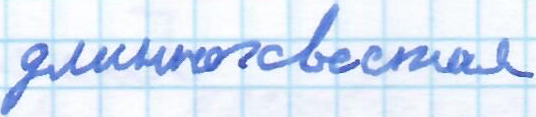длиннохвостая
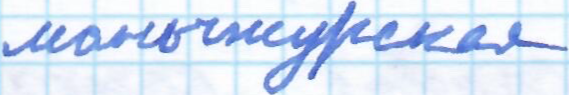маньчжурская
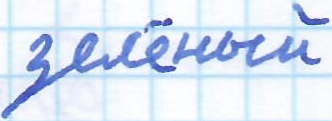зелёный
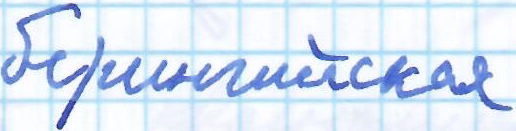берингийская
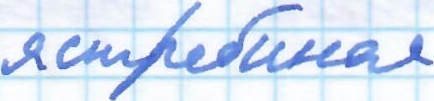ястребиная
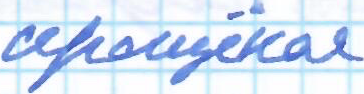серощёкая
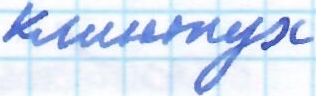клинтух
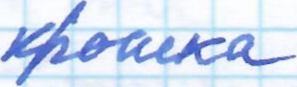крошка
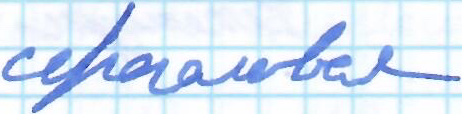сероголовая
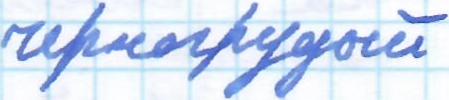черногрудый
